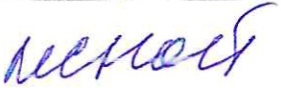лесной
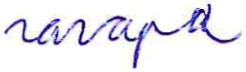гагара
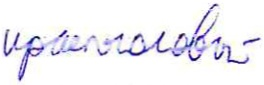краспоголовый
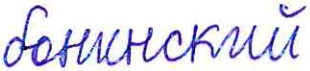бонинский
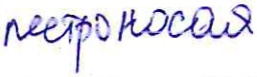пестроносая
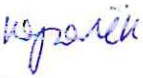королёк
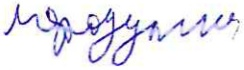мородунки
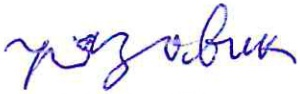грязовик
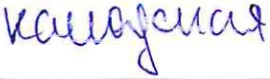канадская
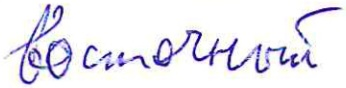восточный
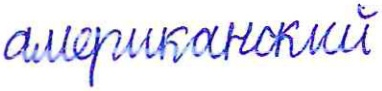американский
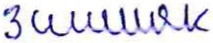зимняк
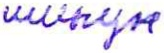шипун
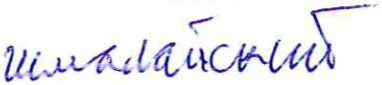гималайский
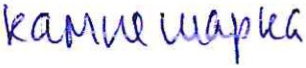камнешарка
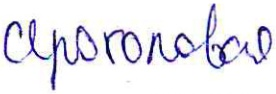сероголовая
